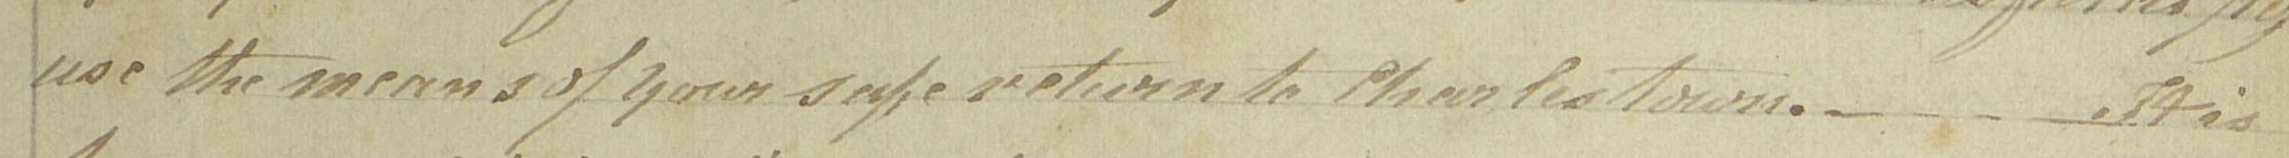use the means of your safe return to Charlestown. It is
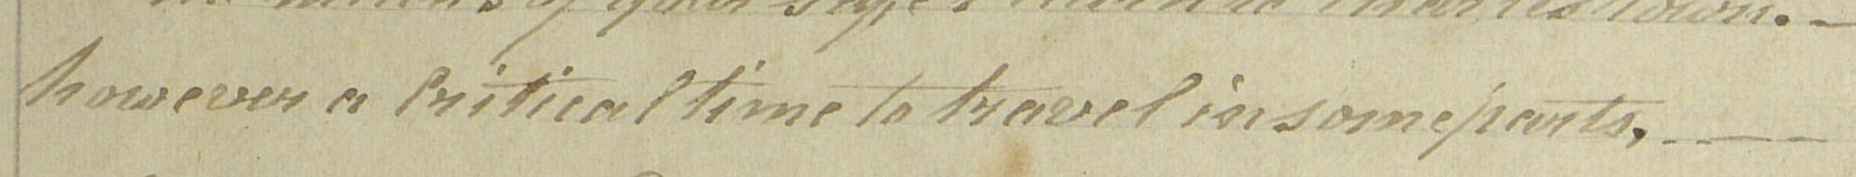however a Critical time to travel in some parts,
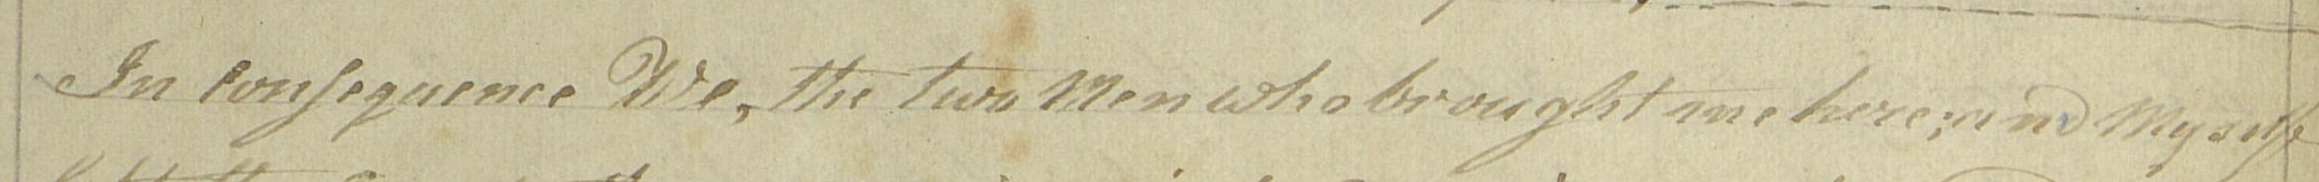In Consequence We, the two Men who brought me here; and Myself
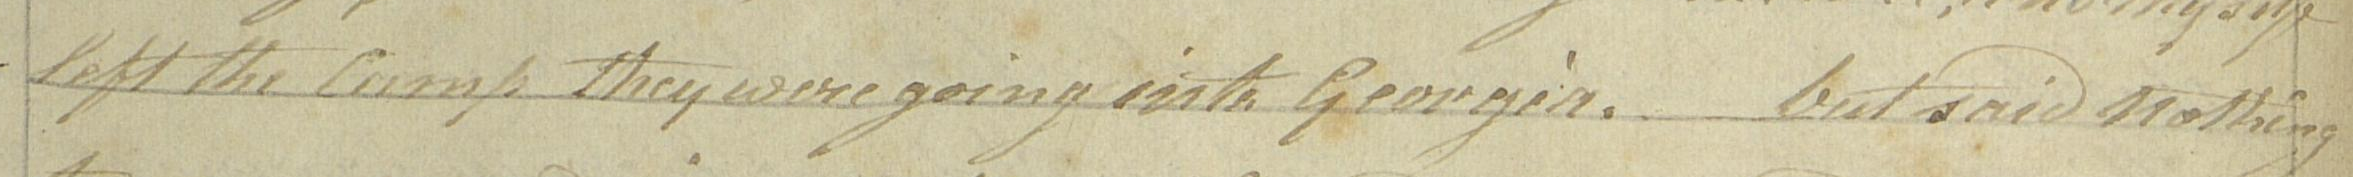left the Camp they were going into Georgia. but said nothing
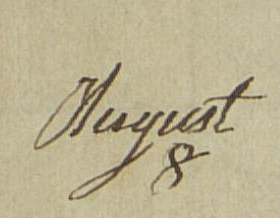August
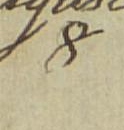8
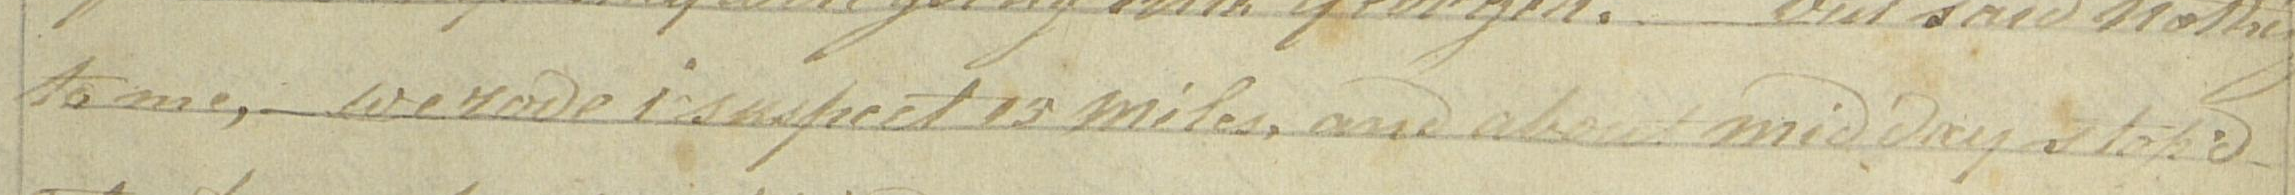to me, we rode i suspect 13 Miles, and about mid day stop'd
